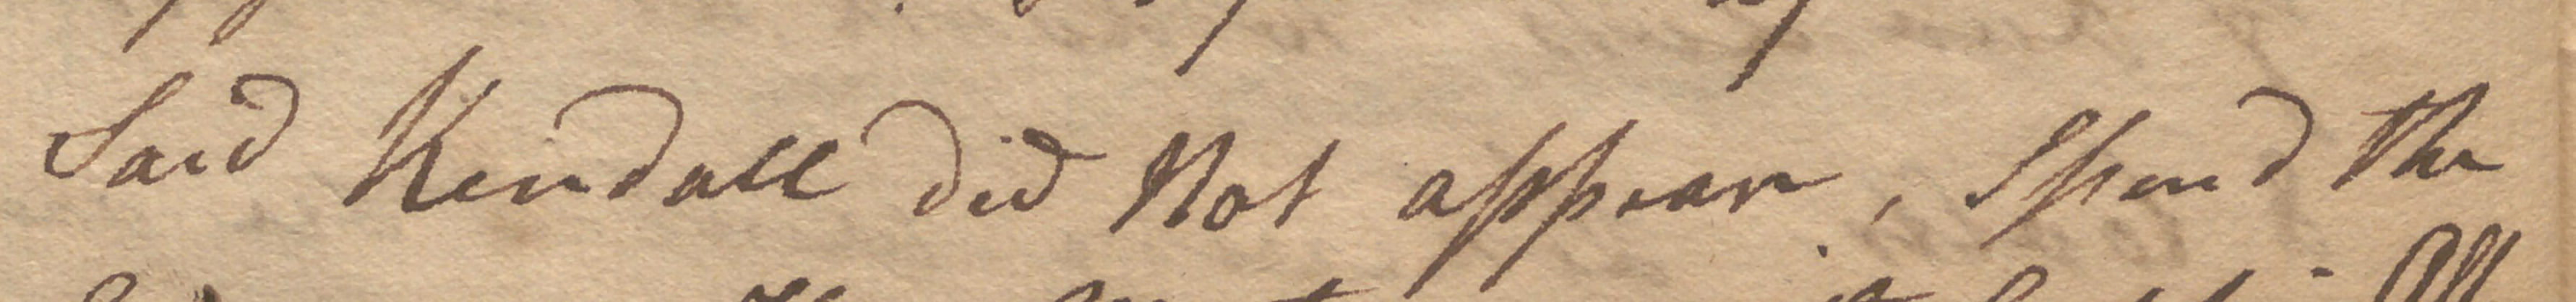Said Kendall did Not appear, Spend the
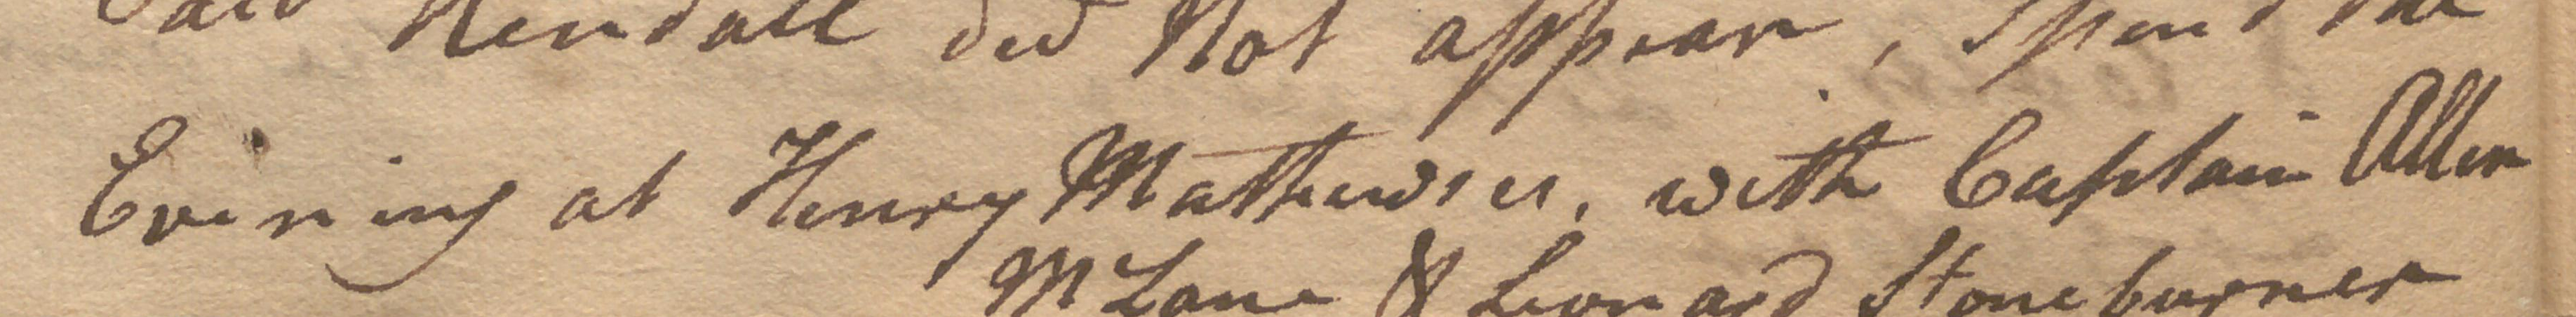Evening at Henry Mathewses, with Captain Allen
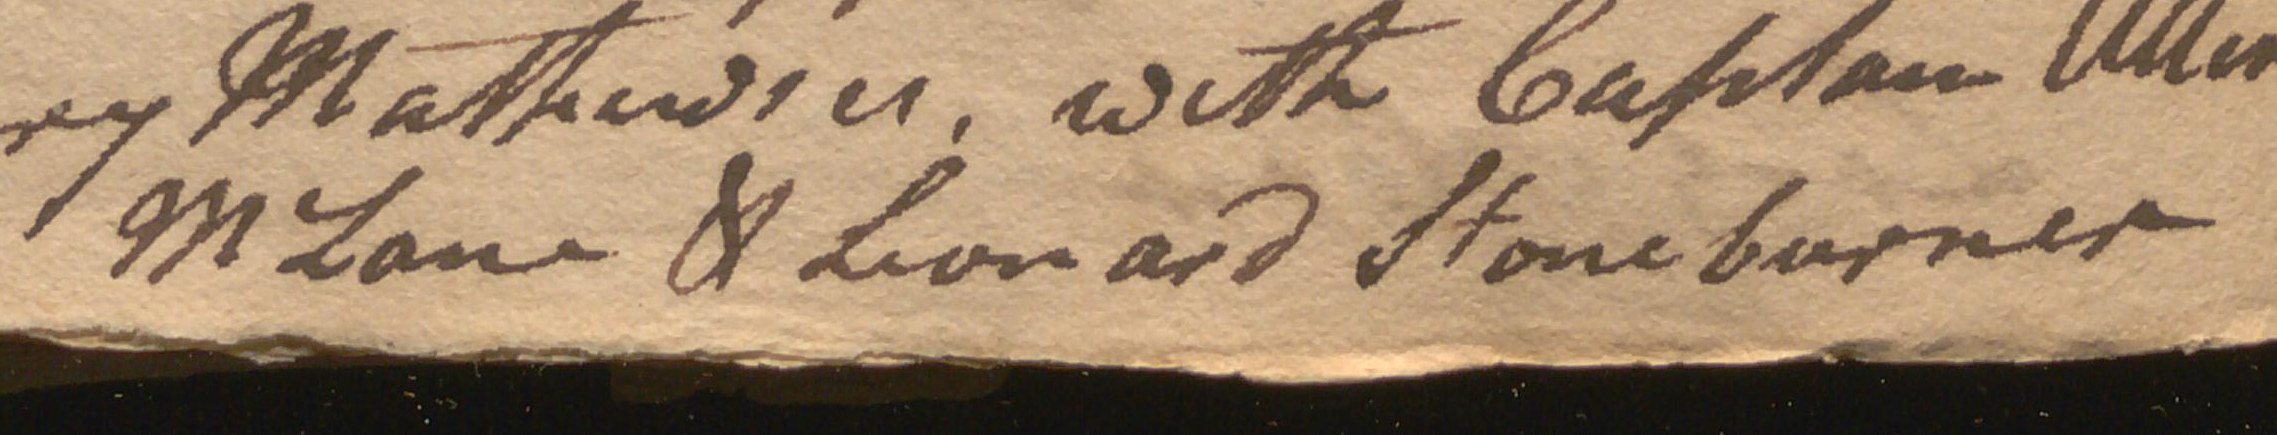M^r Lane & Leonard Stoneburner
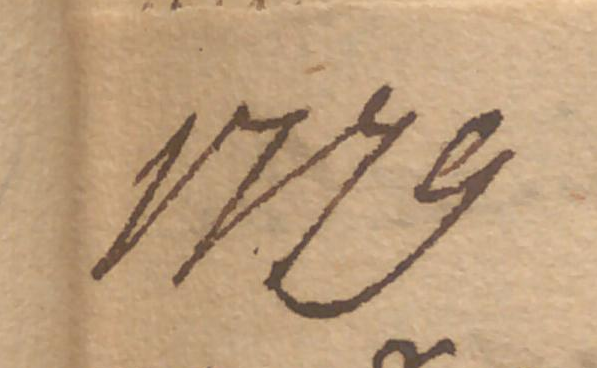1779
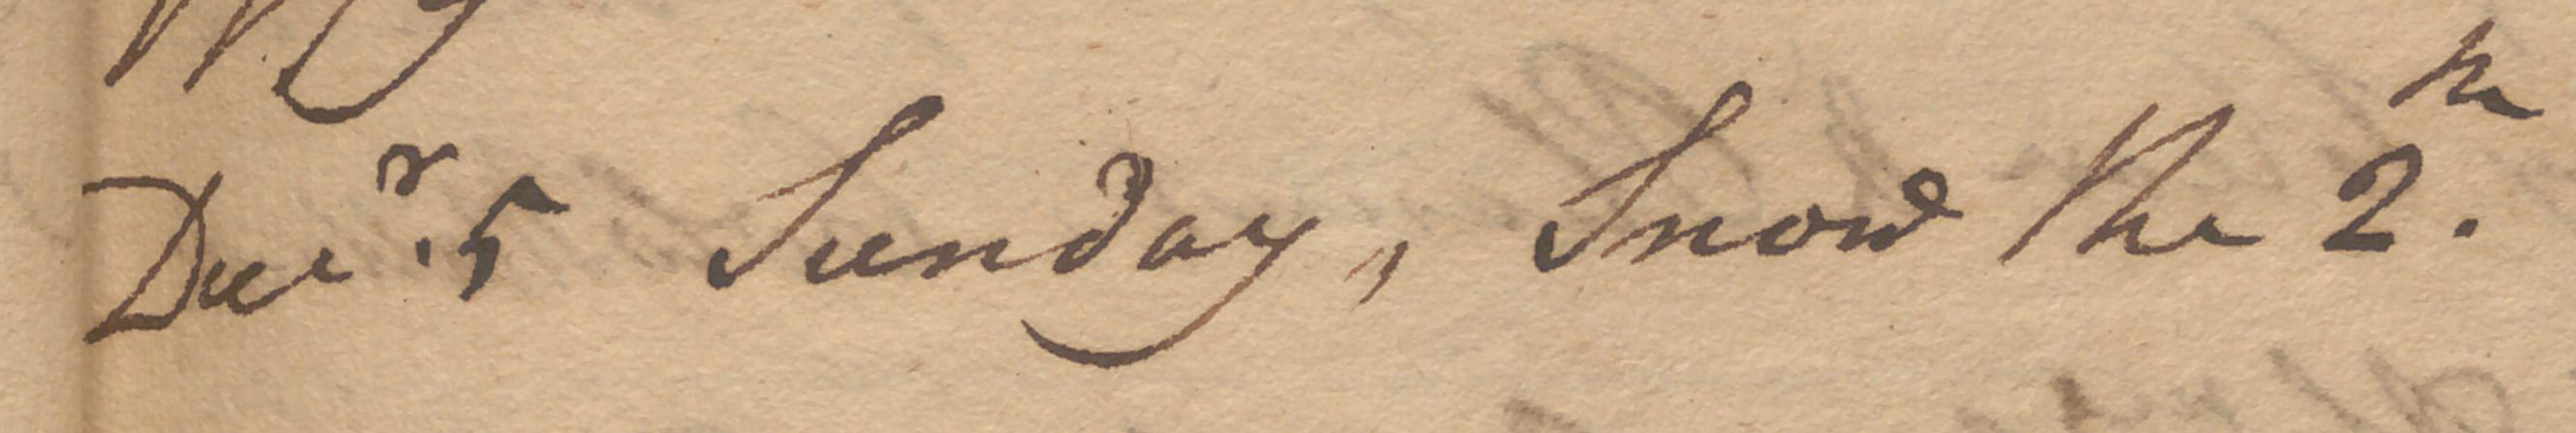Dec^r. 5 Sunday, Snow the 2^th.
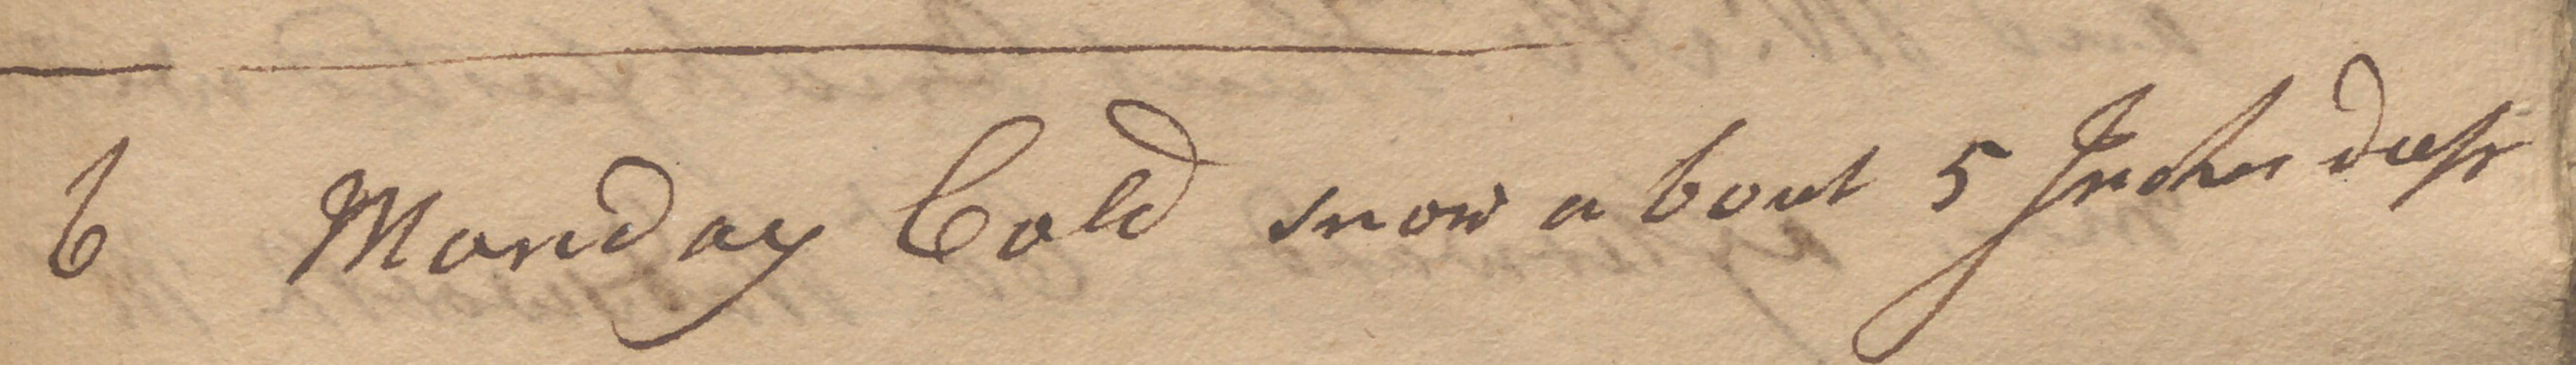6 Monday Cold snow about 5 Inches deep
